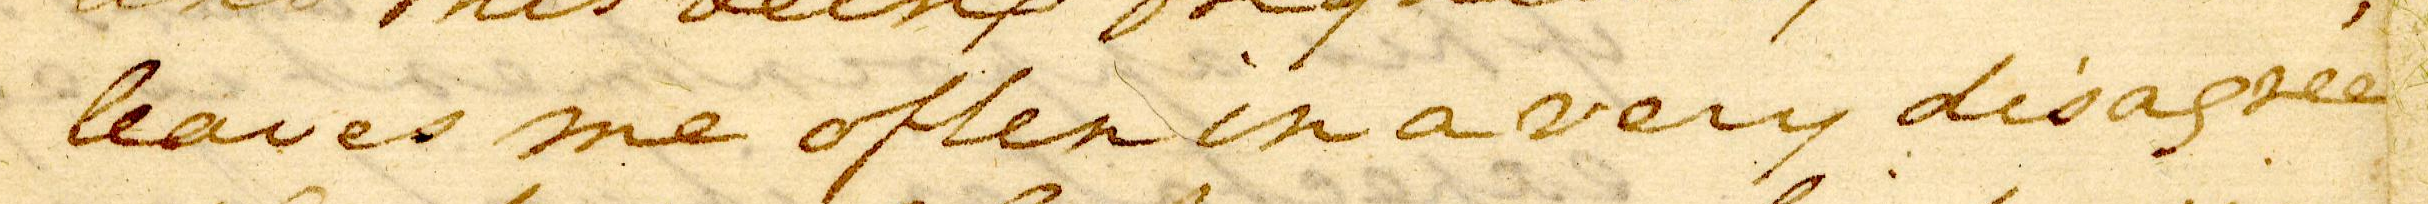leaves me often in a very disagree
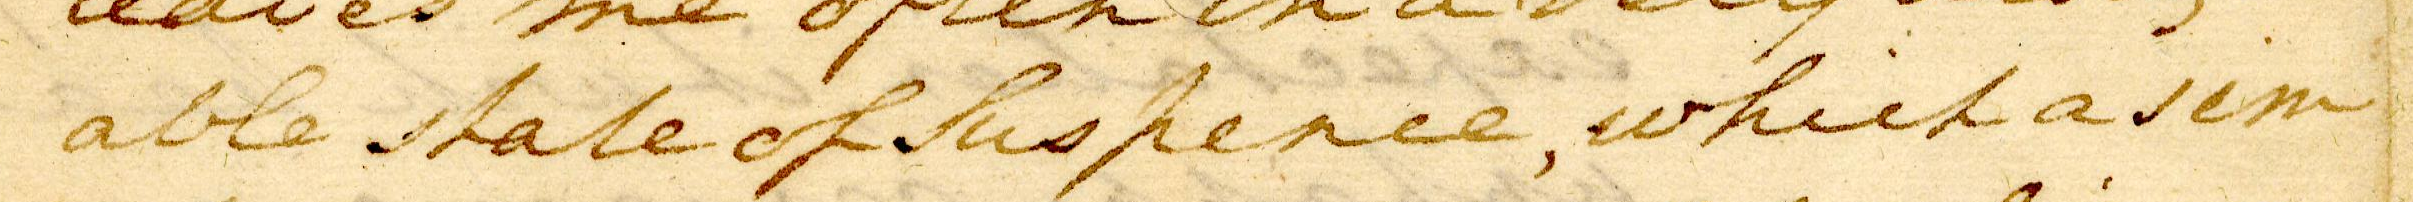able state of Suspence, which a sim
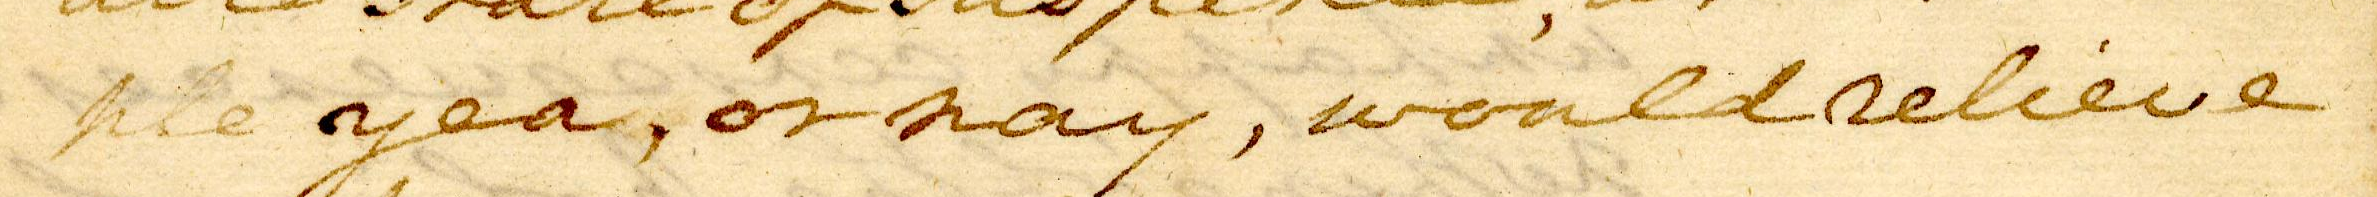ple yea, or nay, would relieve
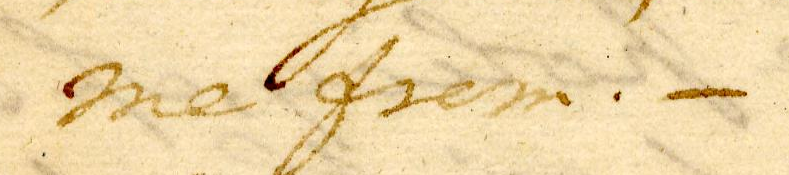me from.-
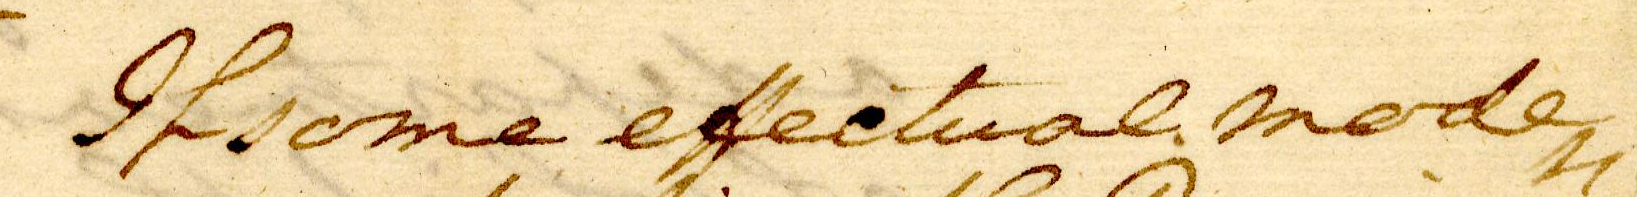If some effectual mode
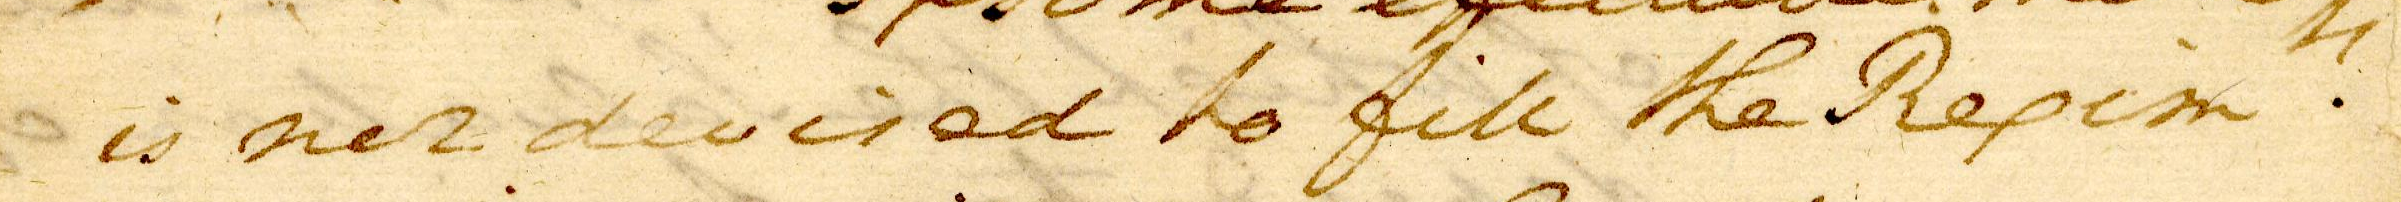is not devisad to fill the Regim^ts
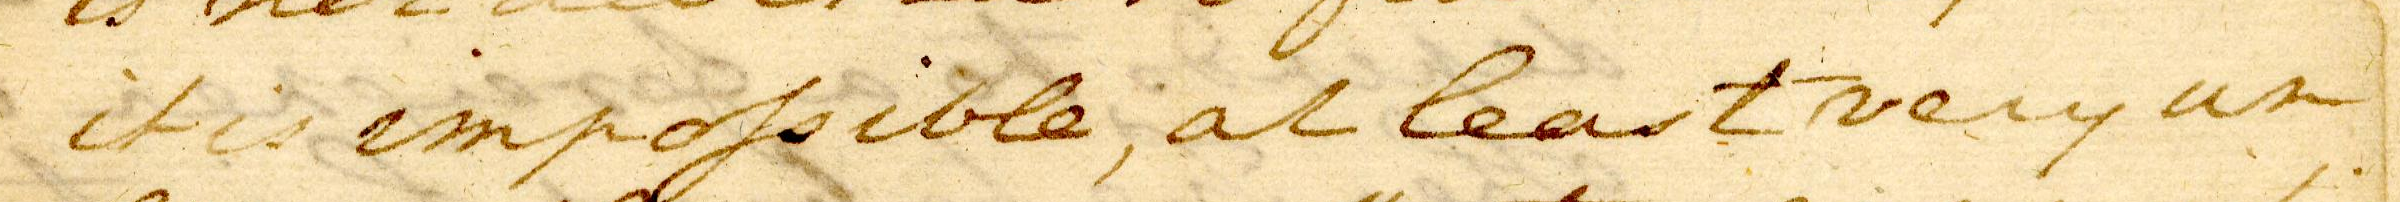it is impossible, at least very un-
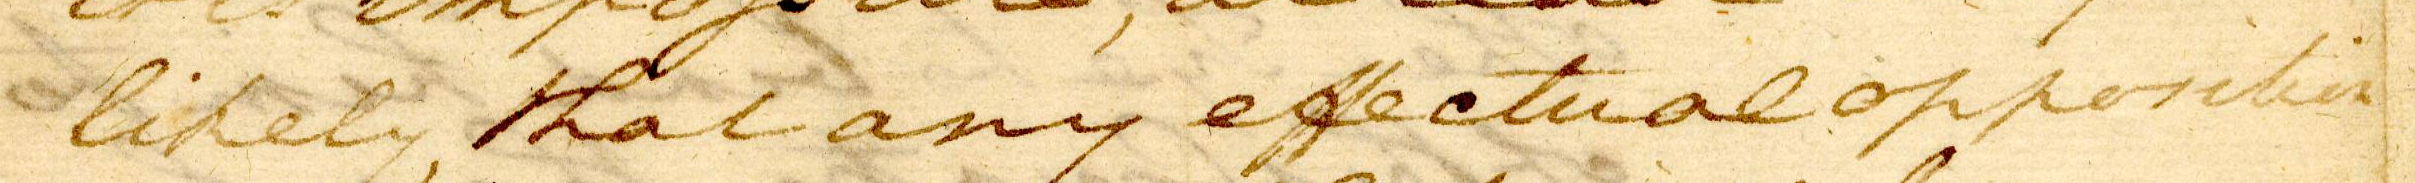-likely that any effectual opposition
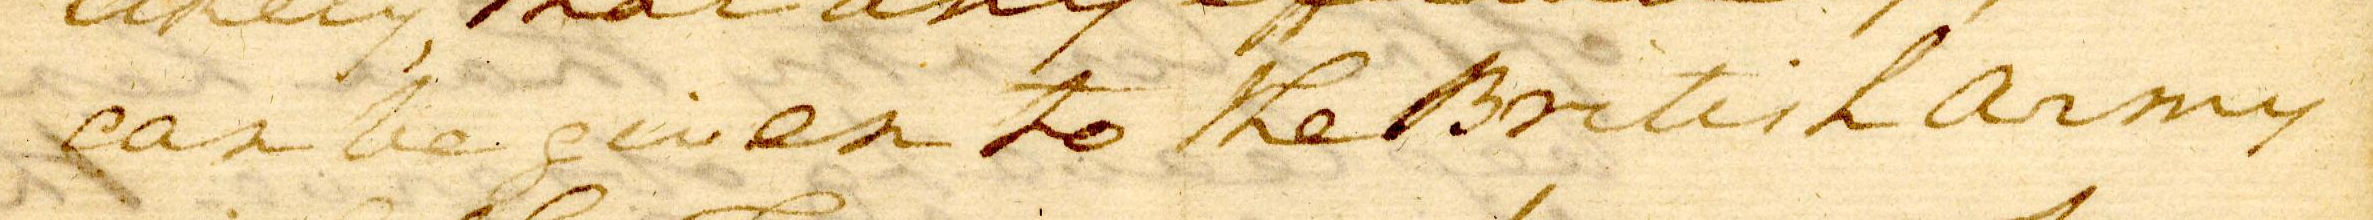can be given to the British army
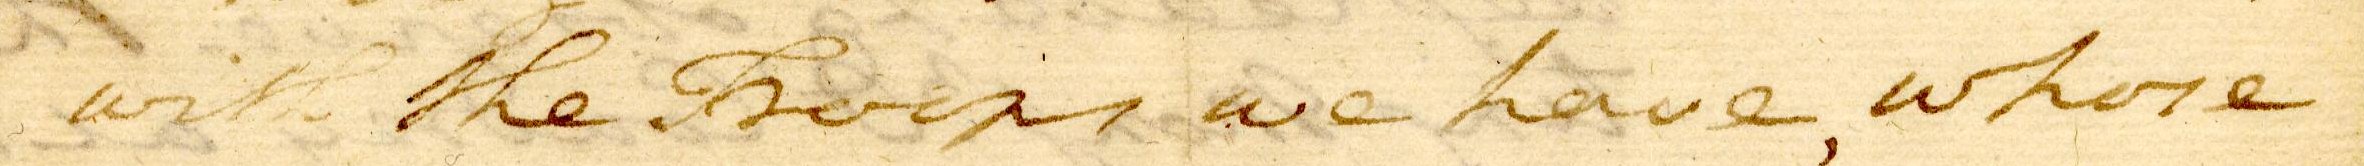with the troops we have whose
